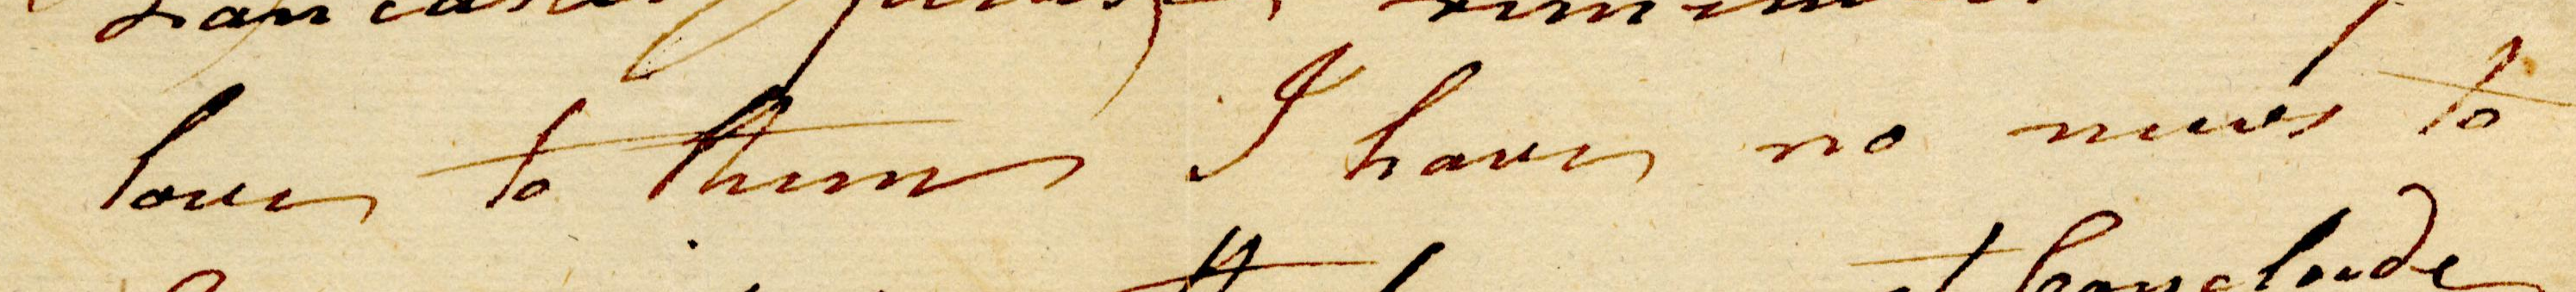love to them I have no news to
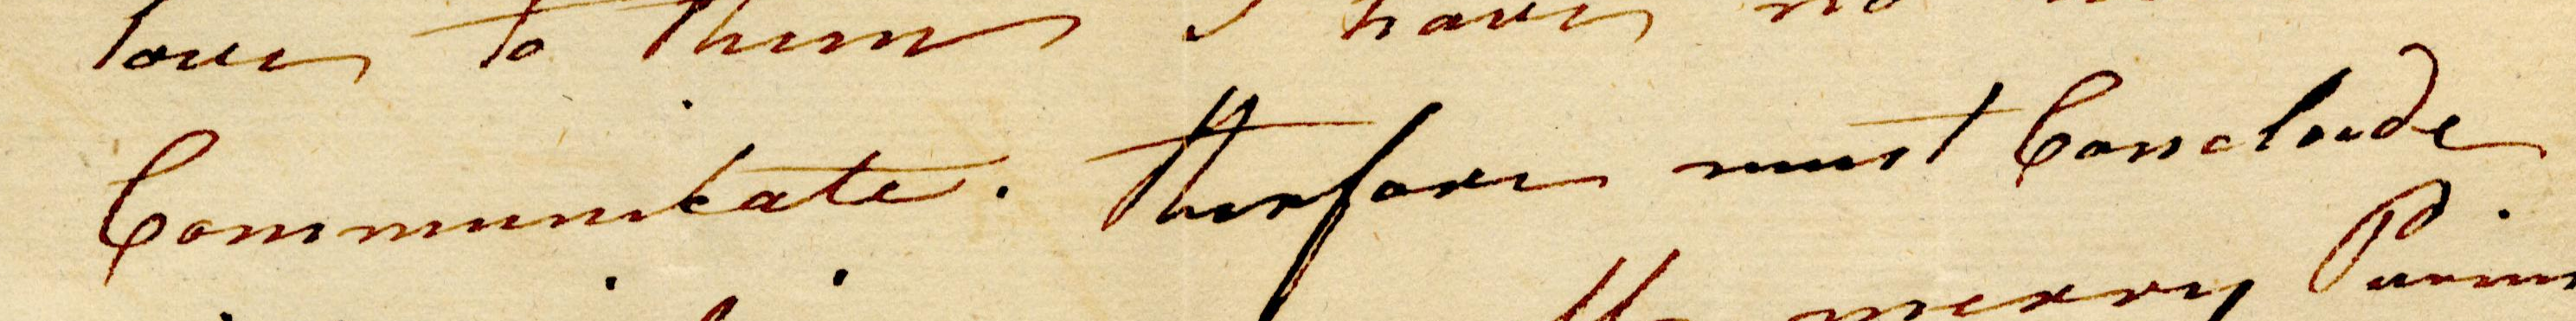communicate. therfore must Conclude
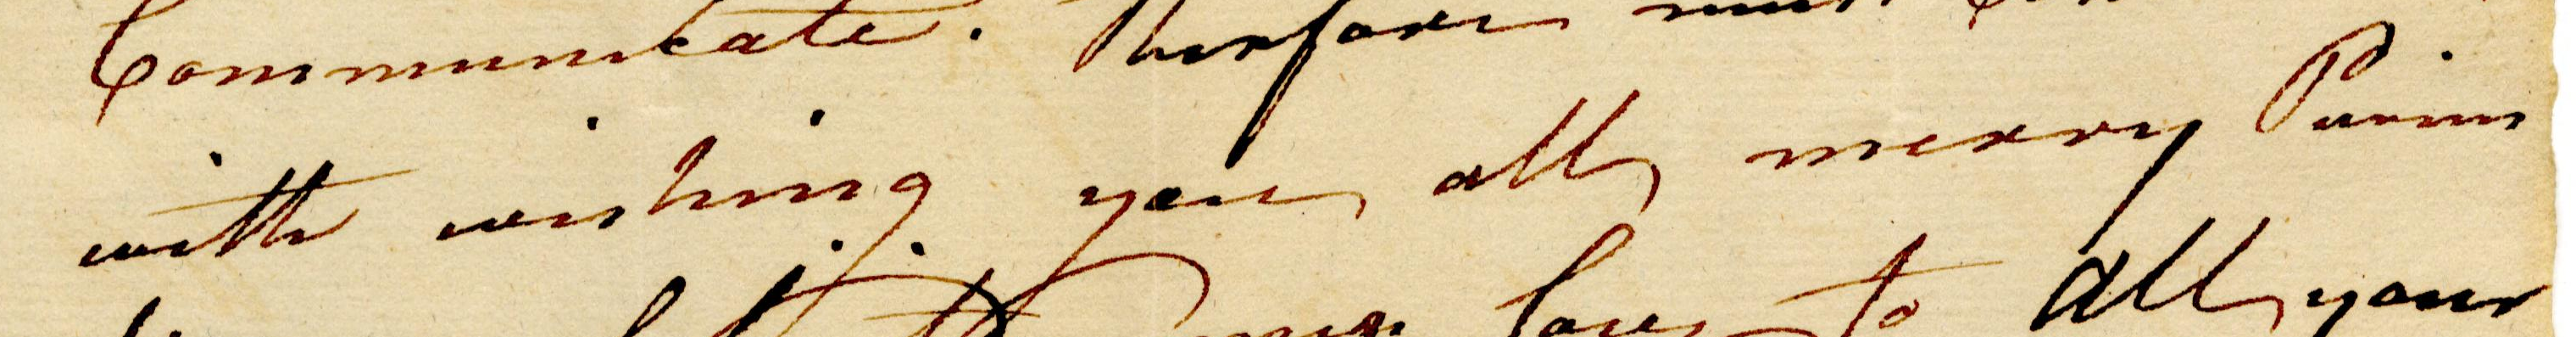with wishing you all merry Purim
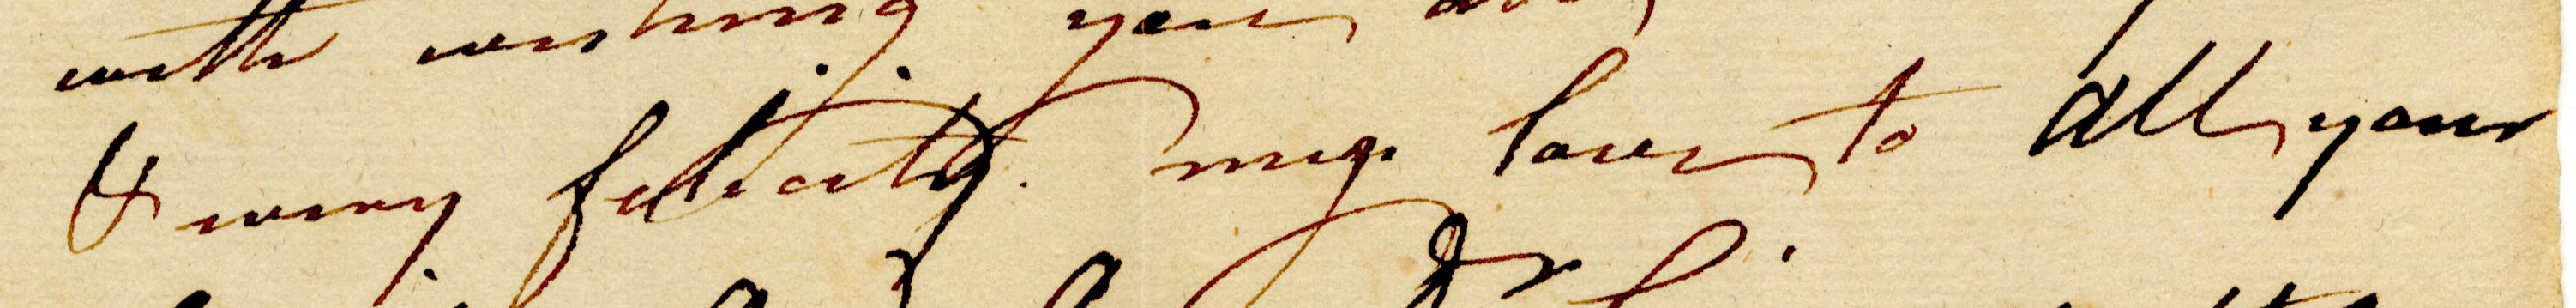& every felicity. my love to All your
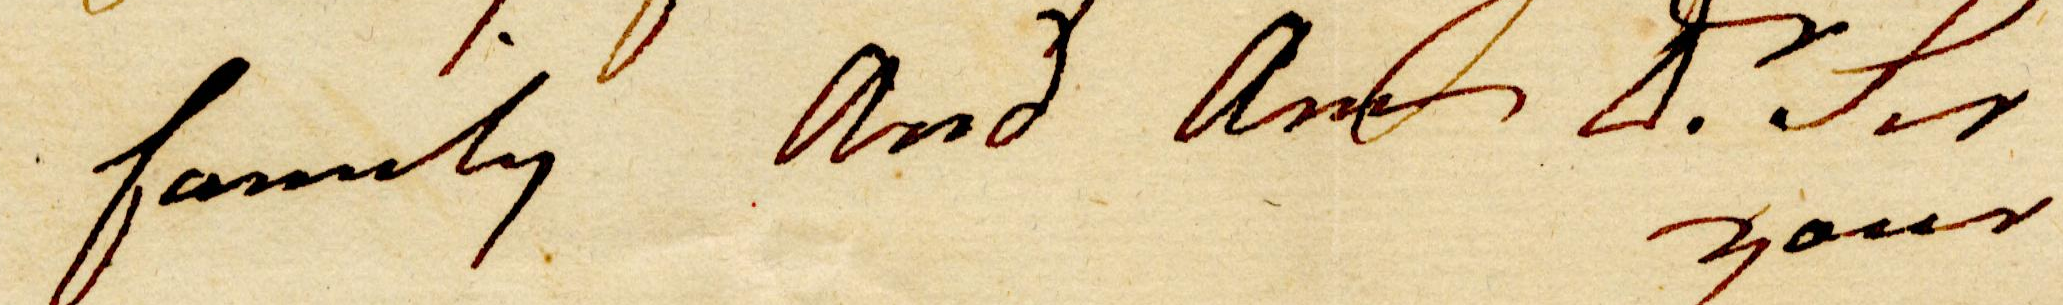family and am D^r Sir
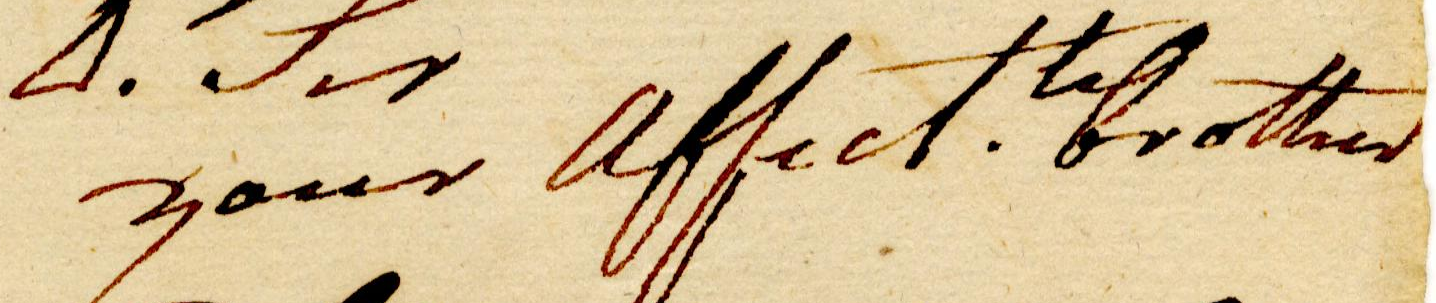your Affect^te Brother
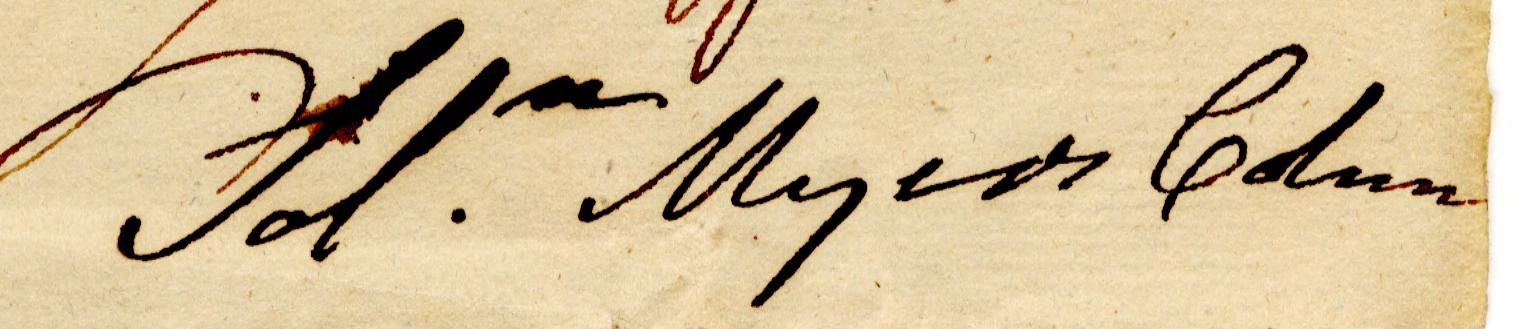Sol^m Myers Cohen
